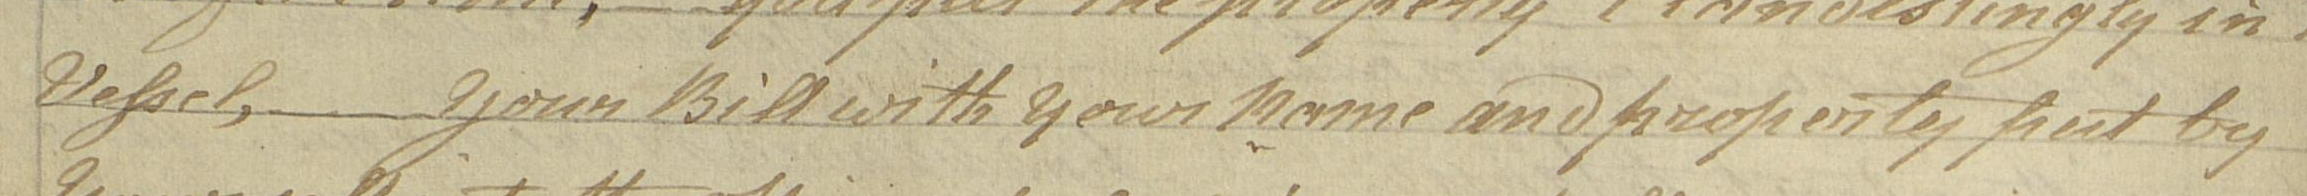Vessel, Your Bill with your Name and property put by
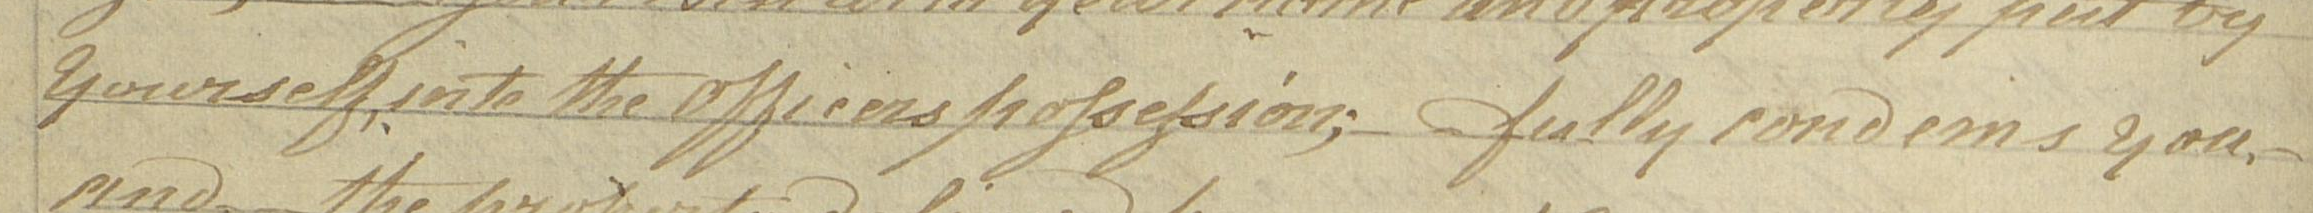yourself into the Officers possession; fully condems you
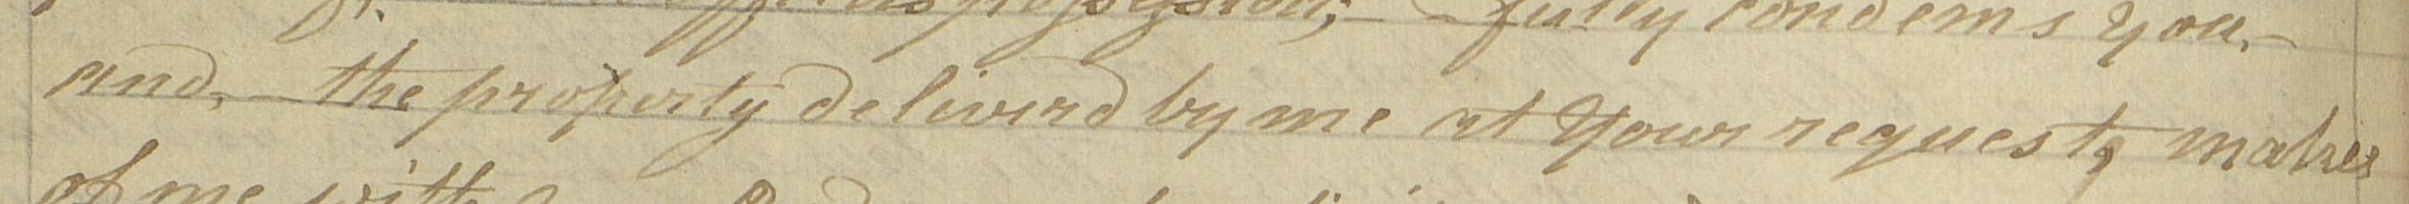and, the property delivered by me at your request makes
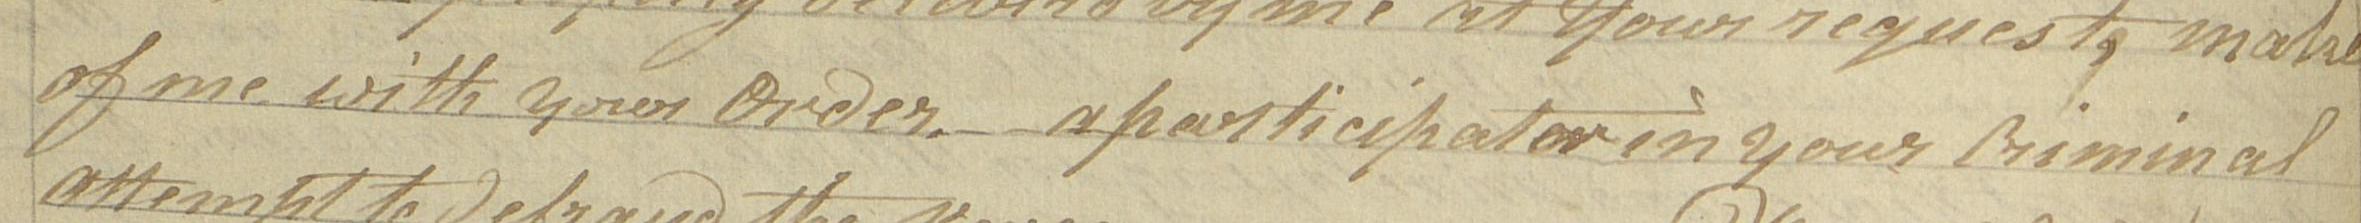of me with your Order. a participator in your Criminal
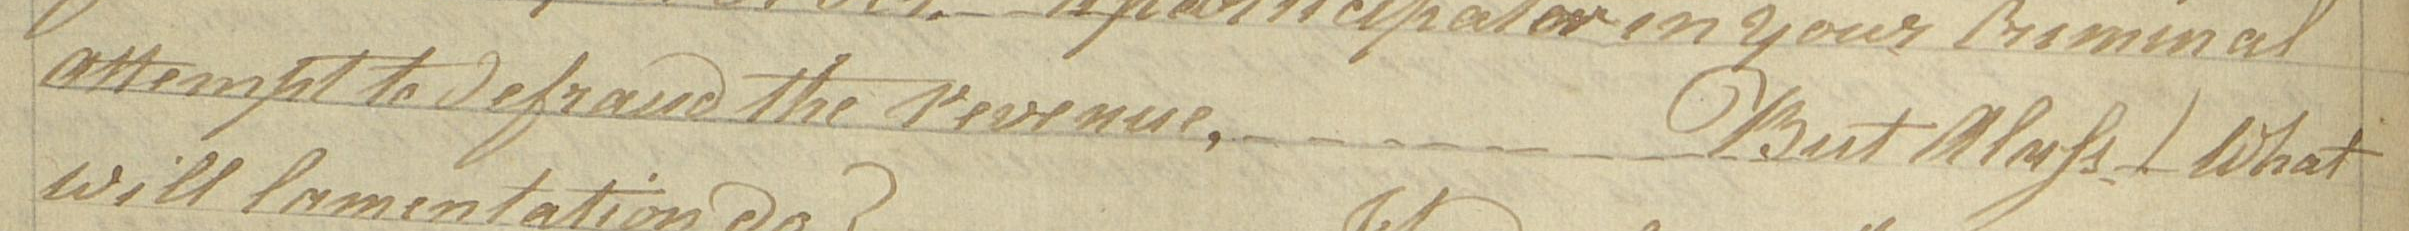attempt to defraud the revenue, But Alass! What
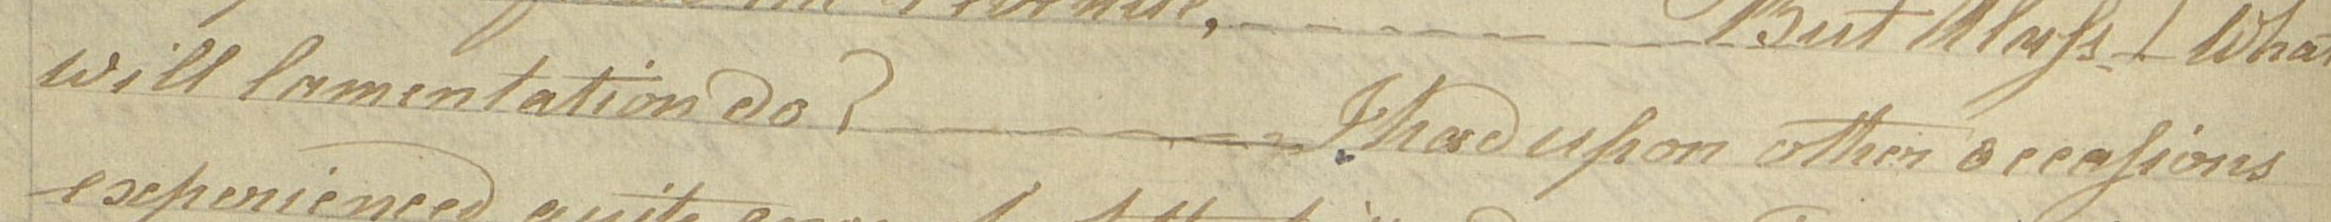will lamentation do? I had upon other occasions
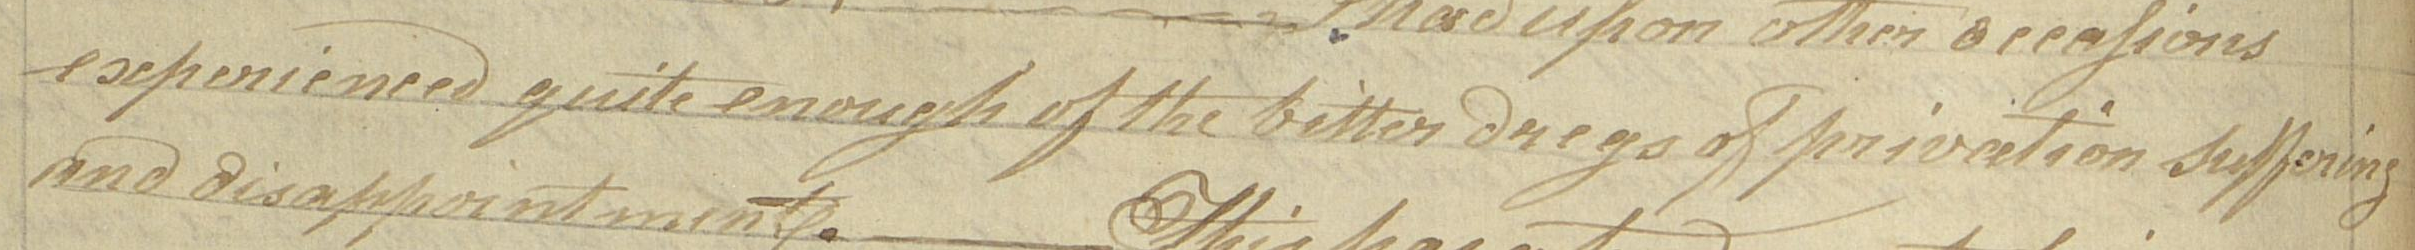experienced quite enough of the better dregs of privation suffering
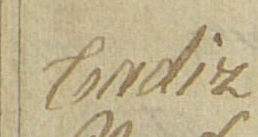Cadiz
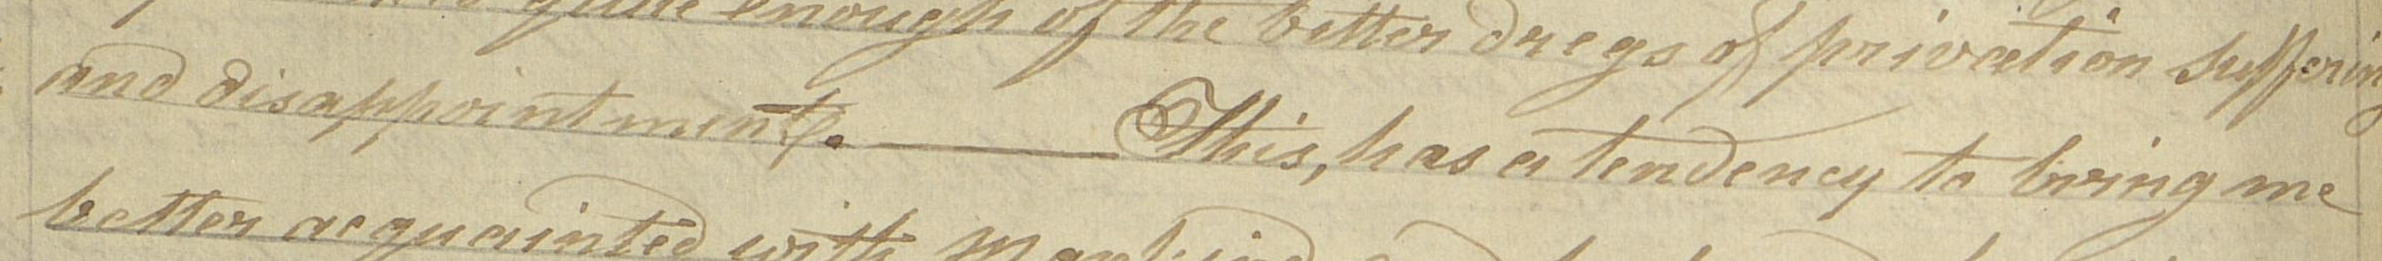and disappointment. This, has a tendency to bring me
